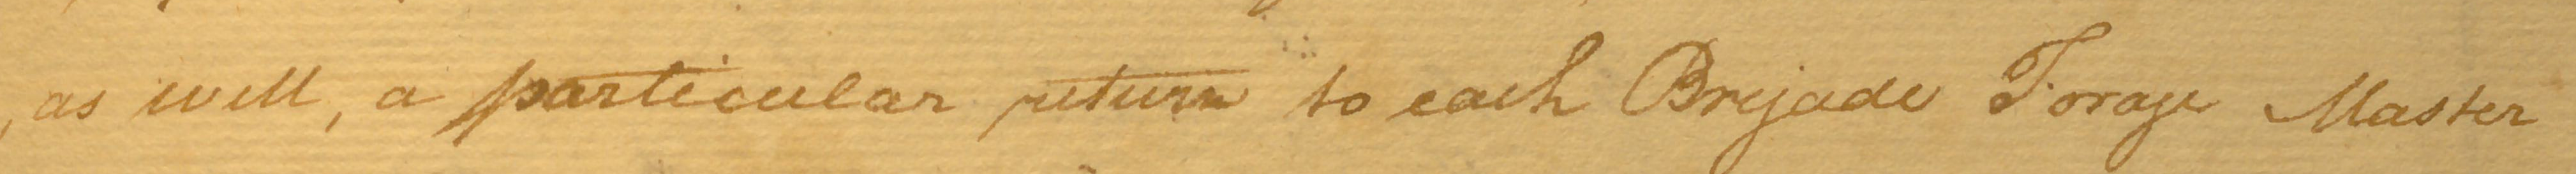as well, a particular return to each Brigade Forage Master
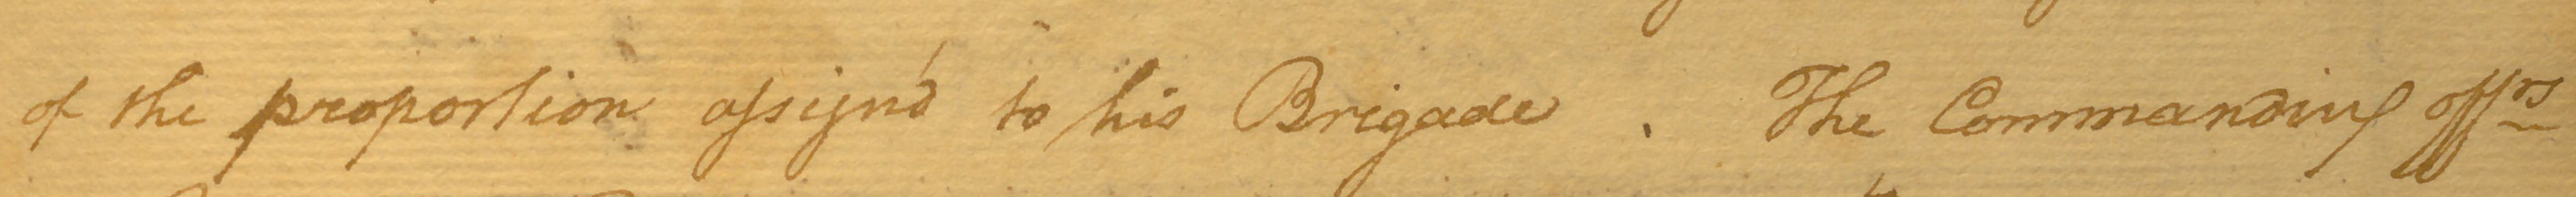of the proportion assign'd to his Brigade. The Commanding off^rs
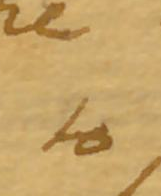to
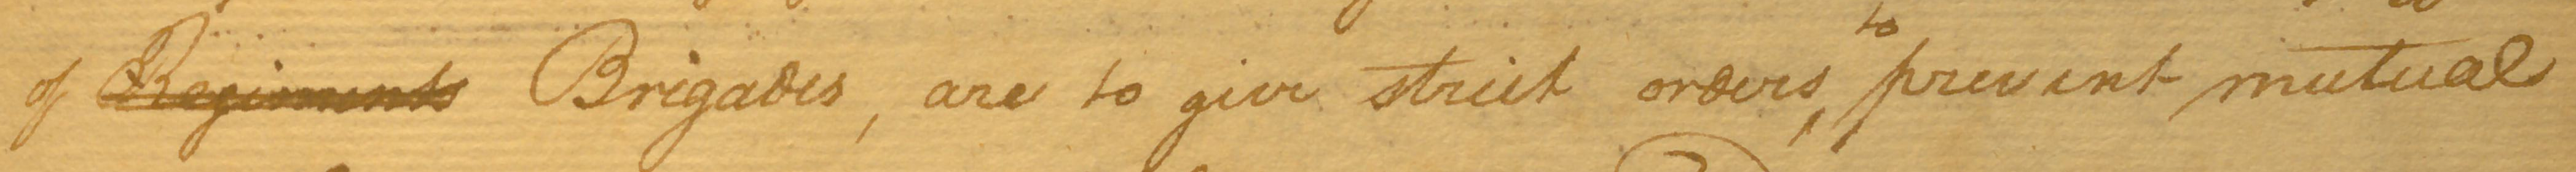of [Regiments] Brigades, are to give strict orders ^ prevent mutual
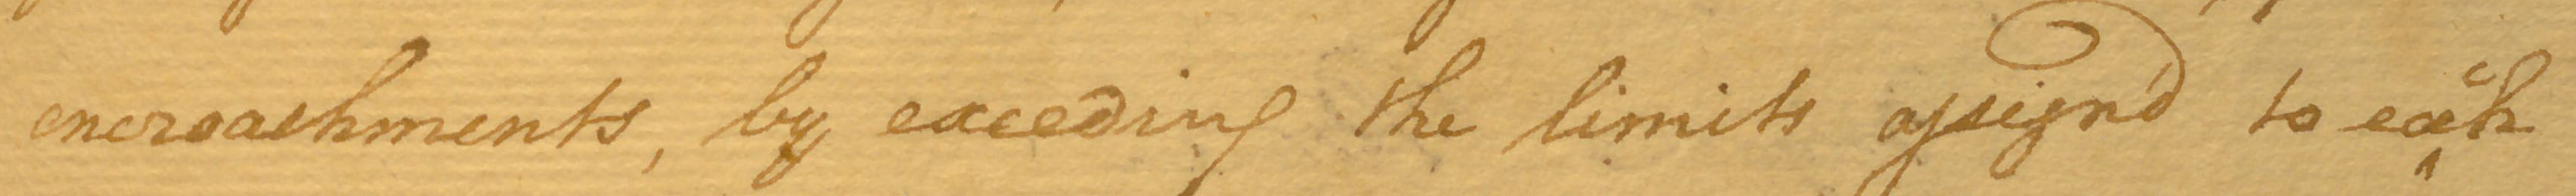encroachments, by exceding the limits assign'd to ea^ch
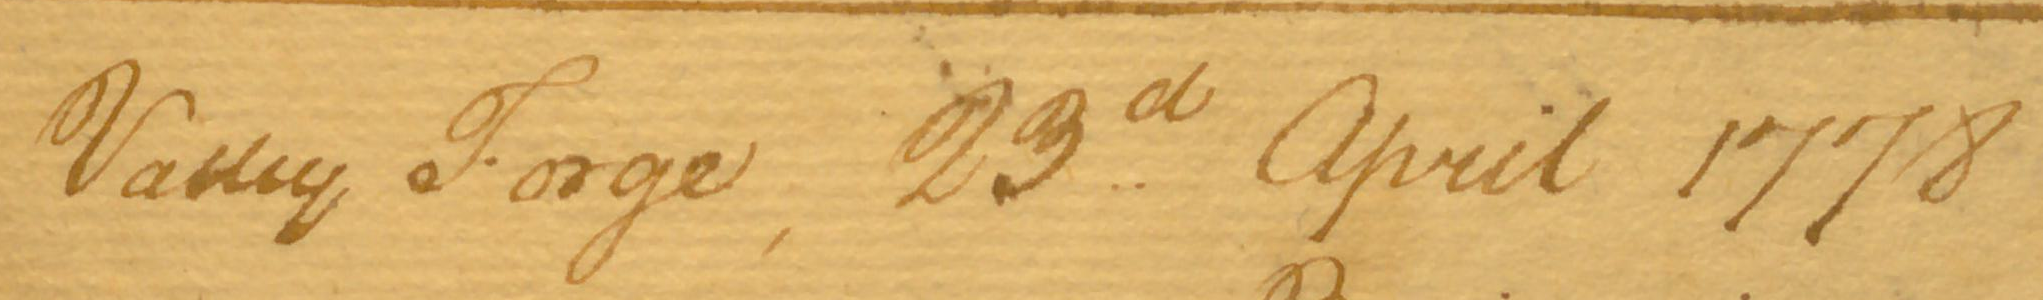Valley Forge, 23^d. April 1778
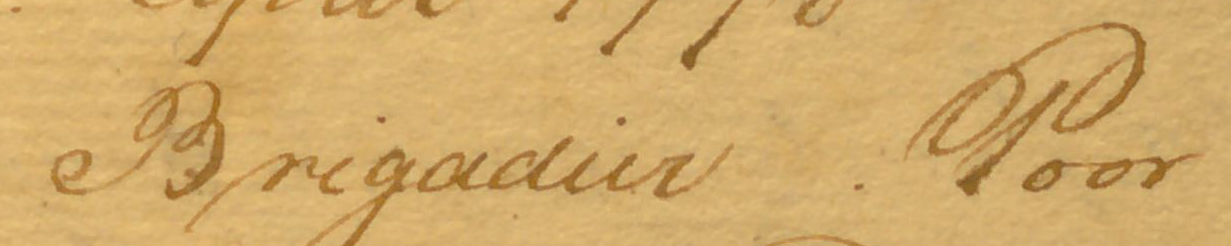Brigadier Poor
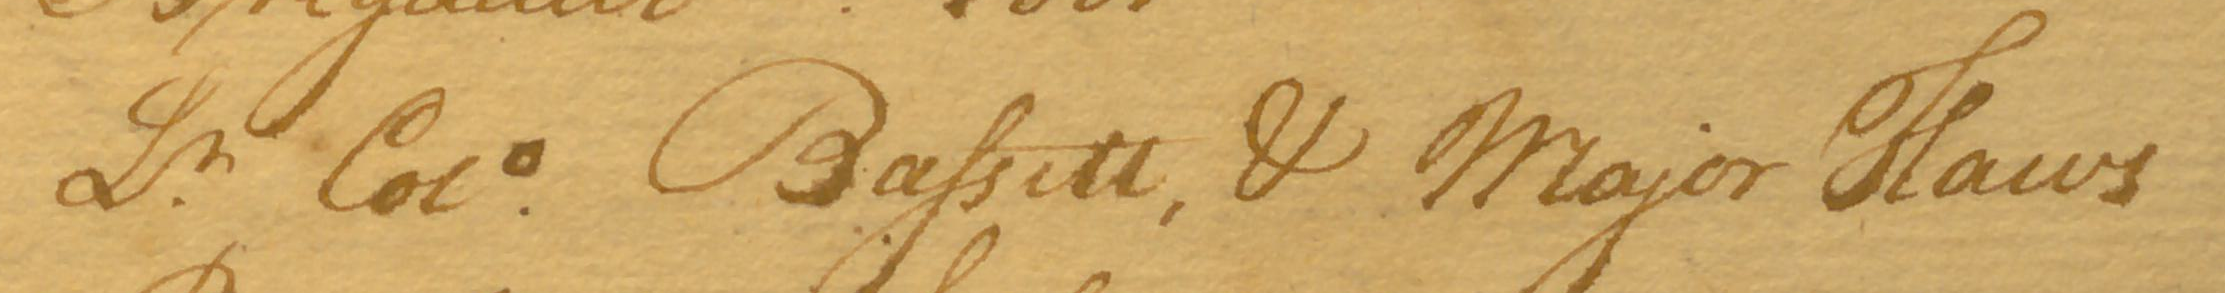L^t. Col^o. Bassett, & Major Haws
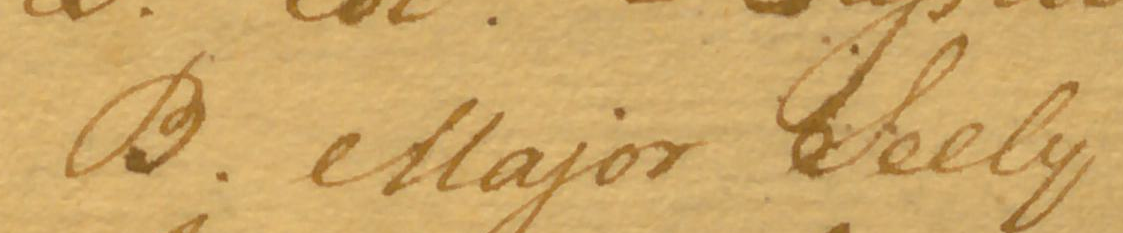B. Major Seely
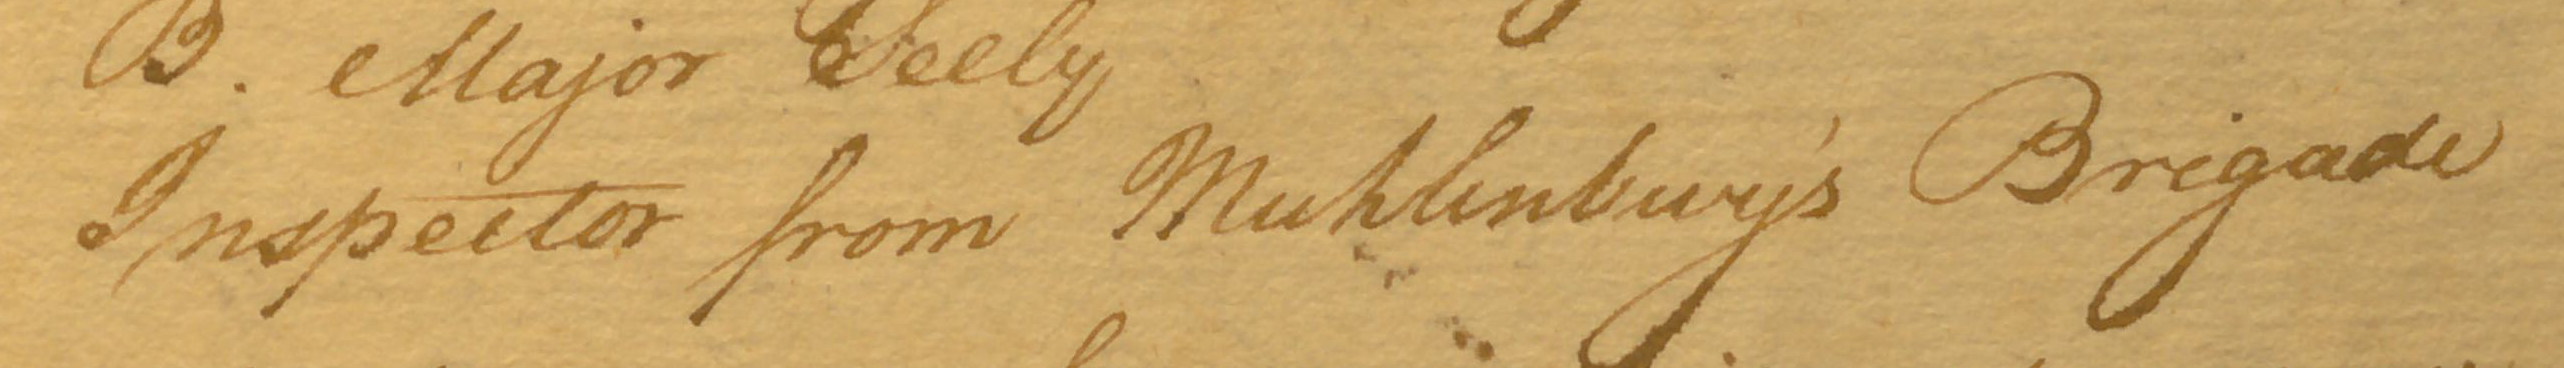Inspector from Muhlenburg's Brigade
